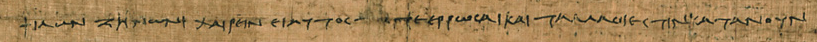φιλων ζηνωνι χαιρειν ειαυτοϲ τεερρωϲαικαιταλλαϲοιεϲτινκατανουν
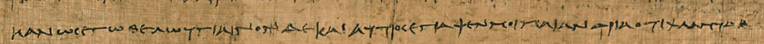ηανωϲεγωθελωυγιαινονδεκαιαυτοϲεγραψενμοιμαιανδριαοτιχλαμυδα
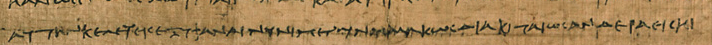αυτηνκελευειϲεξυφαναινυνιμενουνμαλακωϲδιακιταιωϲανδεραειϲηι
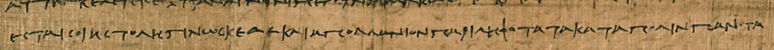εϲταιϲοιηϲτοληγινωϲκεδεκαιαπολλωνιονπαριληφοτατακαταπολινπαντα
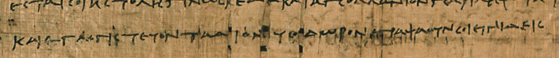καιεγλογιϲτευονταδιονυϲοδωρονεγραψαουνϲοιεινιδειϲ
